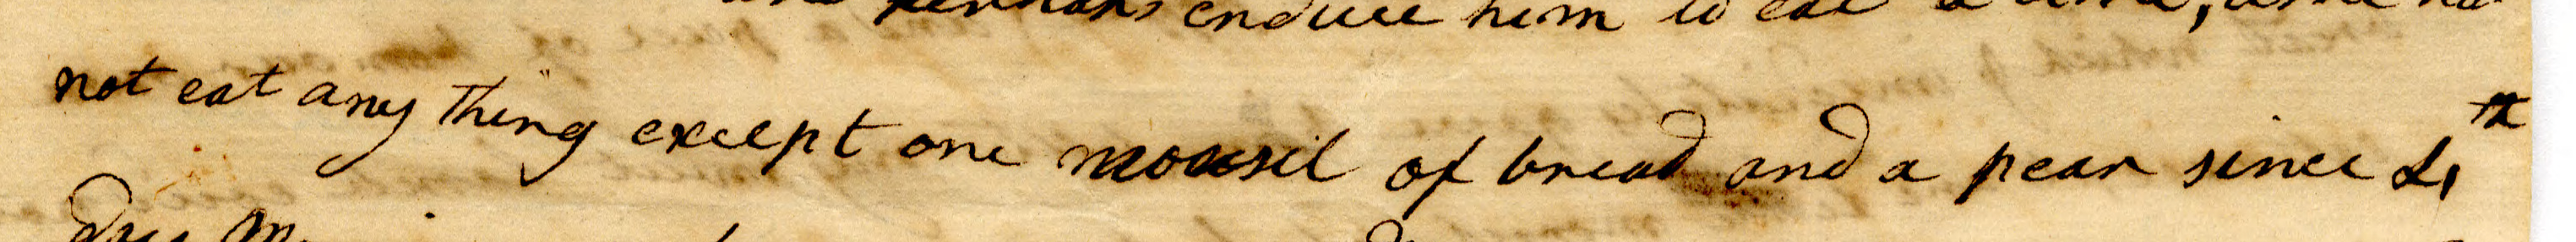not eat any thing except one morsel of bread and a pear since 4^th
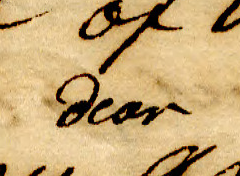dear
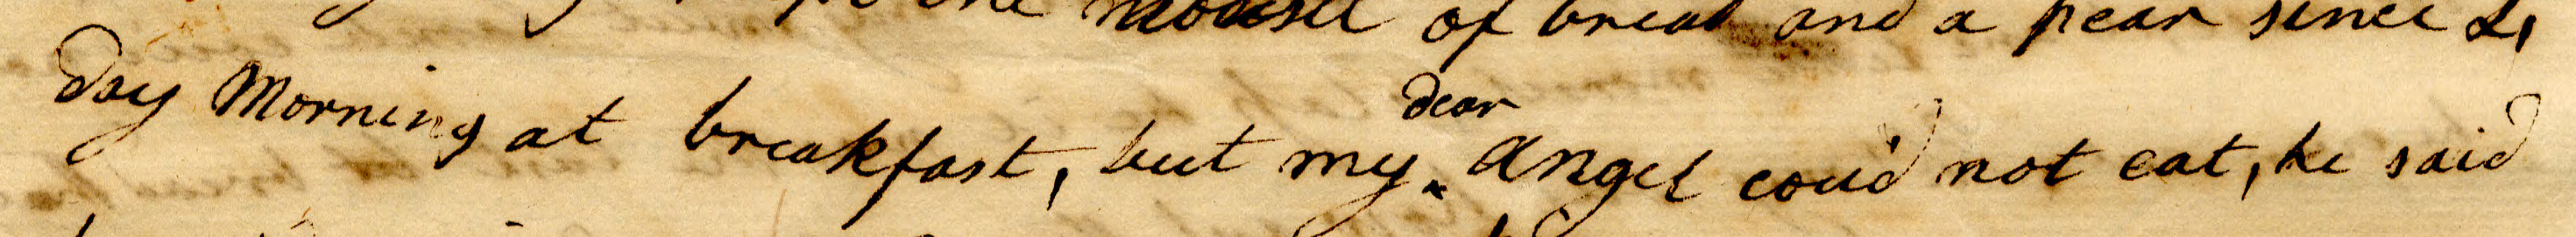day Morning at breakfast, but my ^ angel cou'd not eat, he said
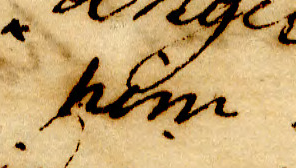him
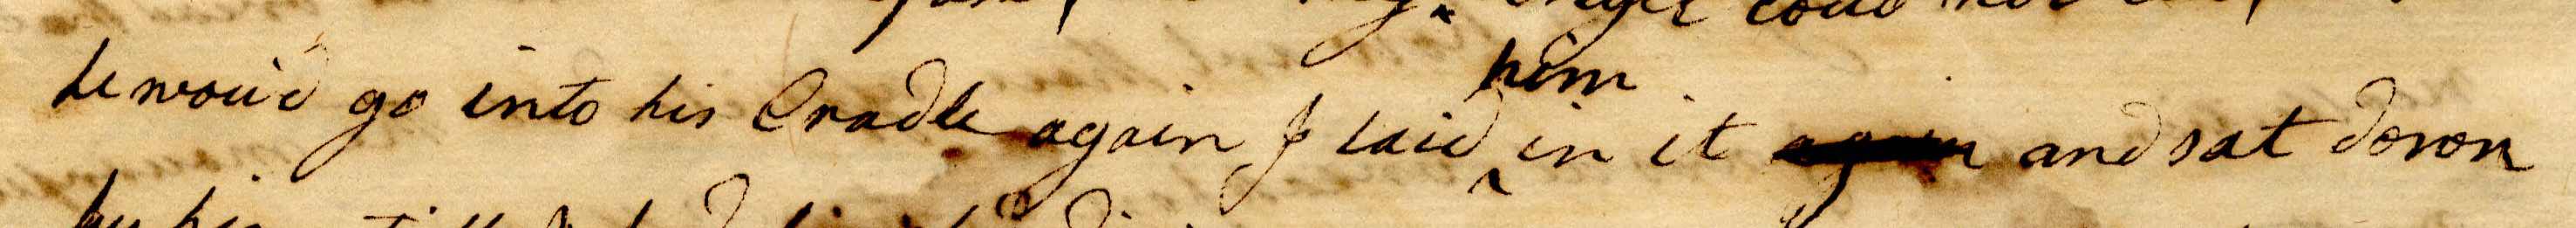he wou'd go into his Cradle again I laid ^ in it [again] and sat down
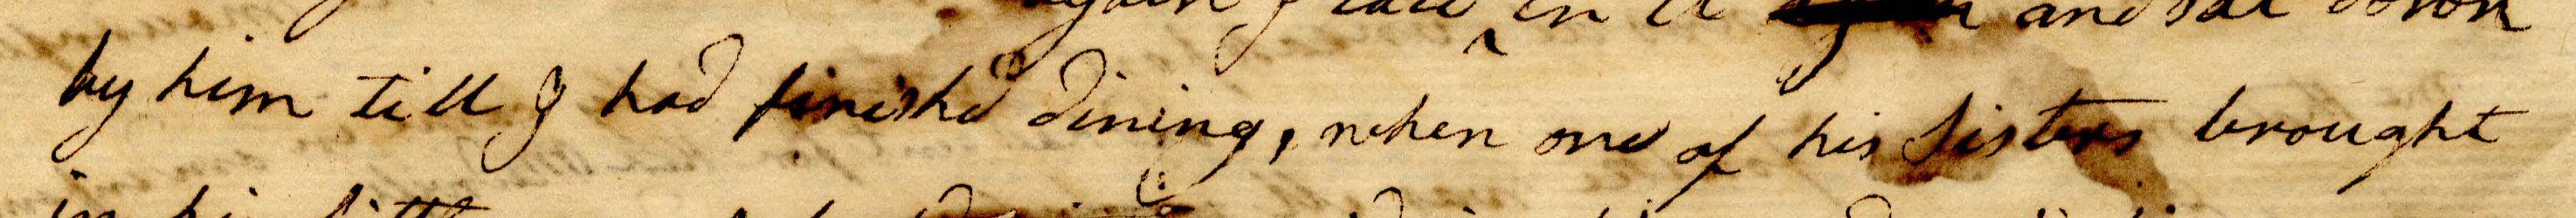by him till I had finishd dining, when one of his Sisters brought
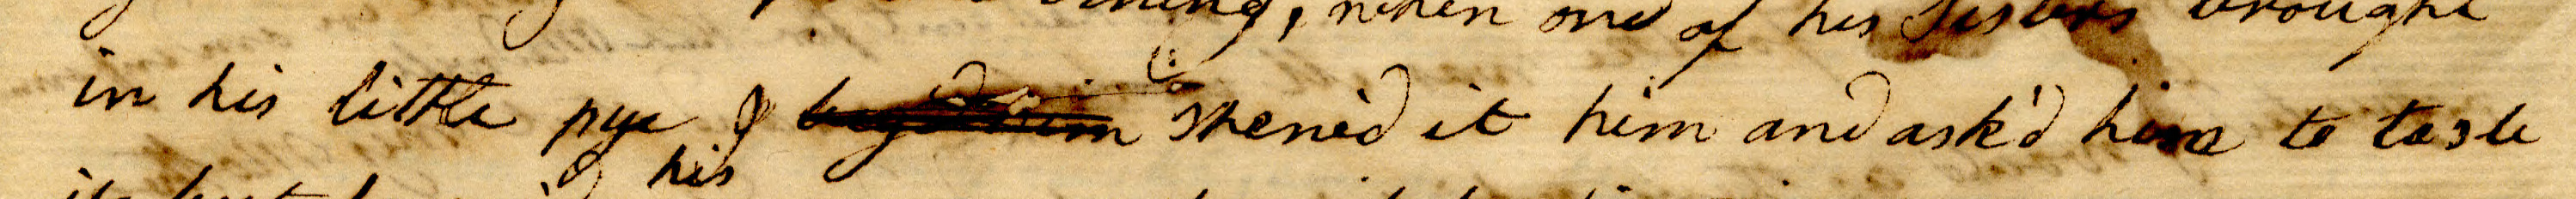in his little pye I [beg'd him] shew'd it him and ask'd him to taste
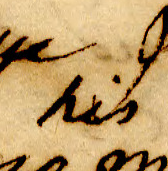his
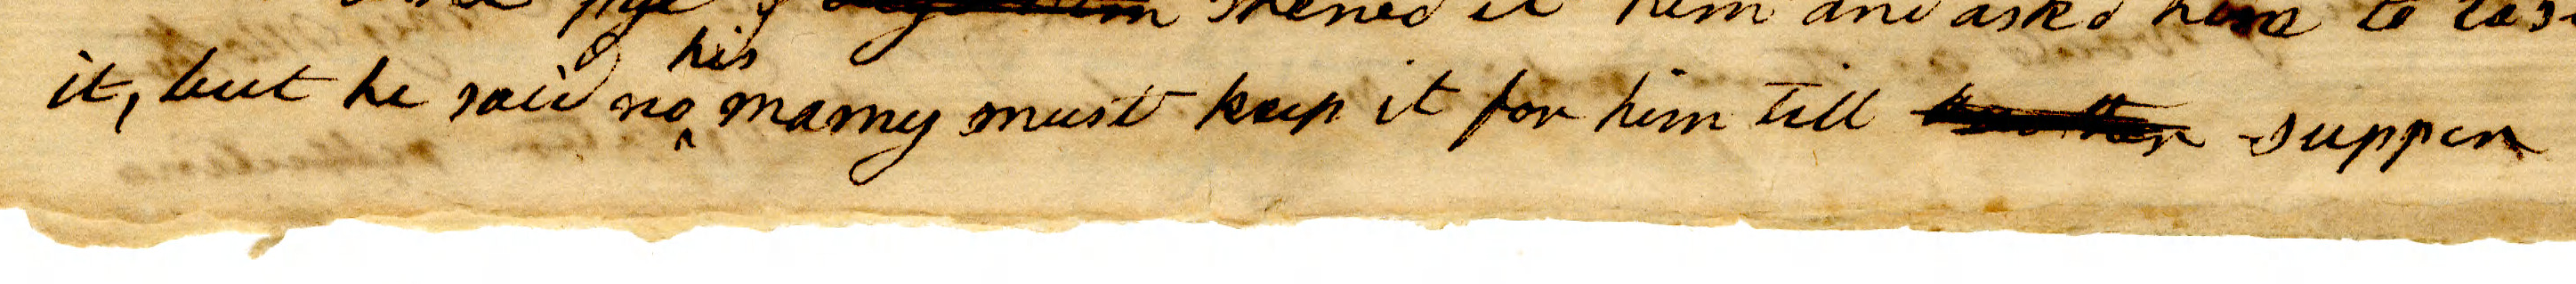it, but he said no ^ mamy must keep it for him till [________] supper
